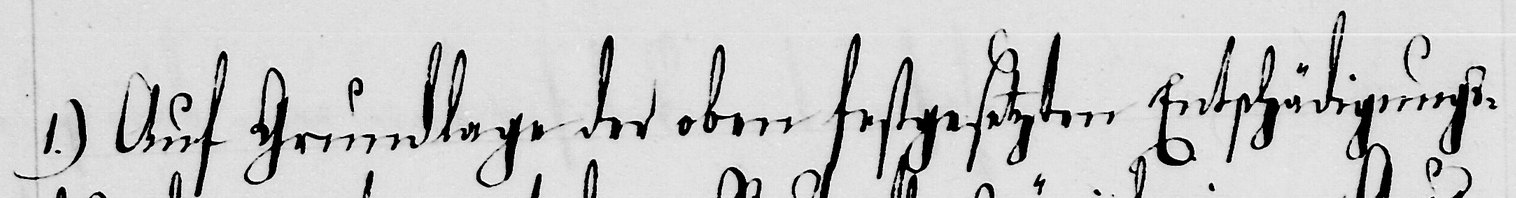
1.) Auf Grundlage der oben festgesetzten Entschädigung¬
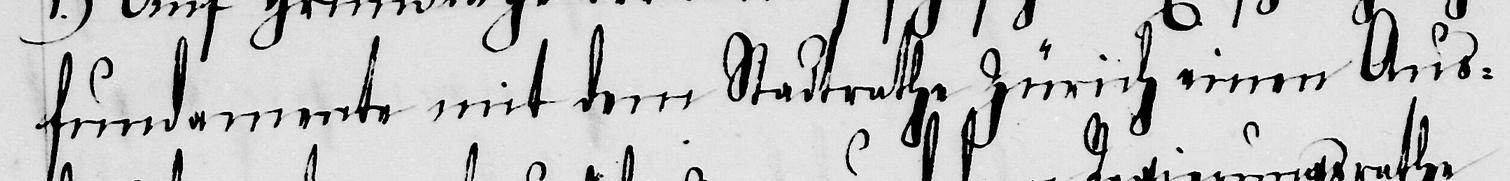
sfundamente mit dem Stadtrathe Zürich einen Aus¬
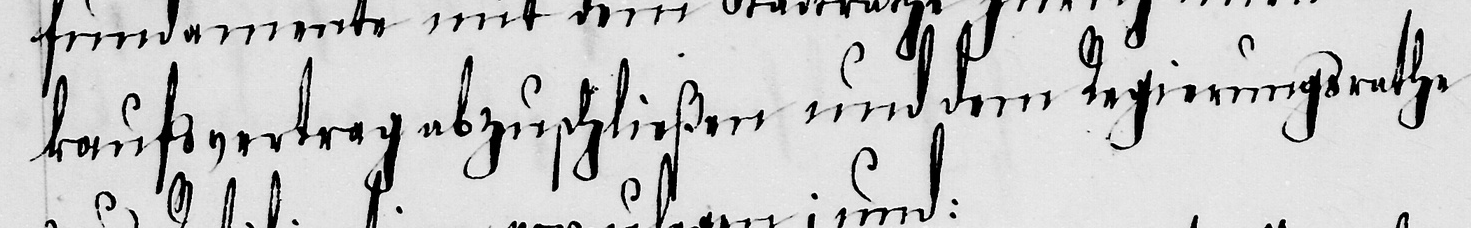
kaufsvertrag abzuschließen und dem Regierungsrathe
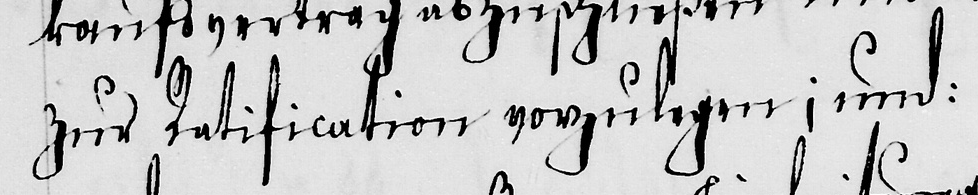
zur Ratification vorzulegen; und:
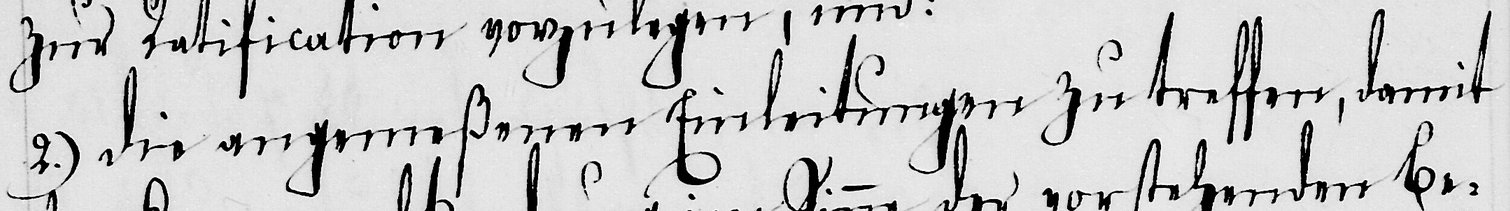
2.) Die angemeßenen Einleitungen zu treffen, damit
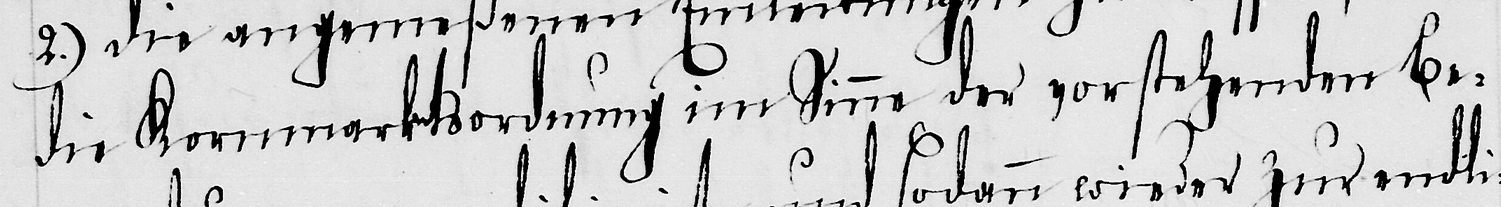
die Kornmarktsordnung im Sinne der vorstehenden Be¬
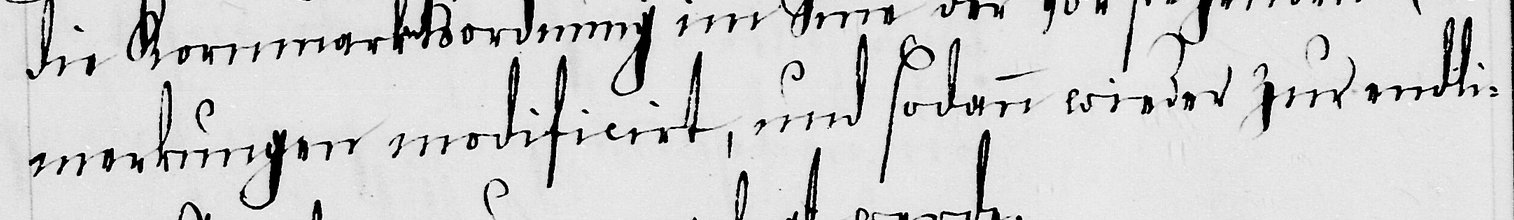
merkungen modificirt, und sodann wieder zur endli¬
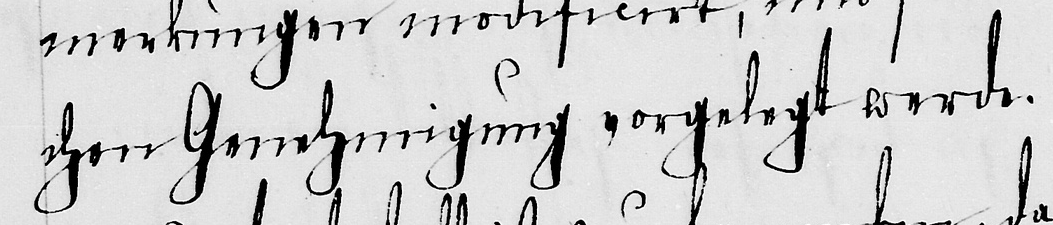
chen Genehmigung vorgelegt werde.
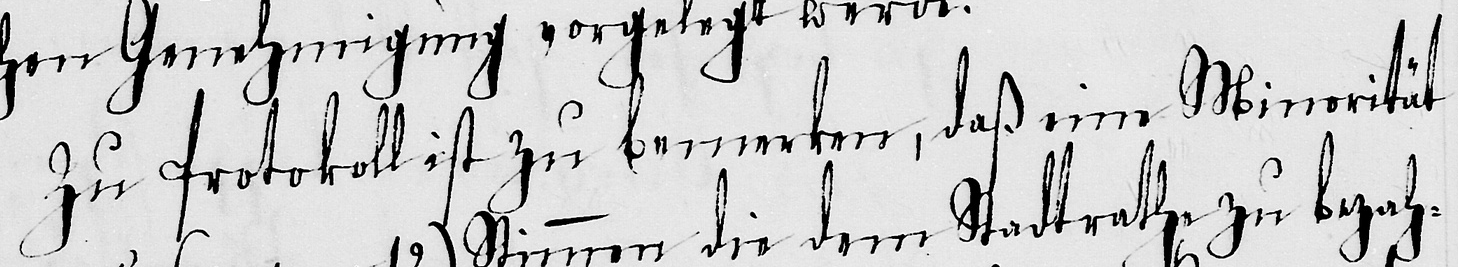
Zu Protokoll ist zu bemerken, daß eine Minorität
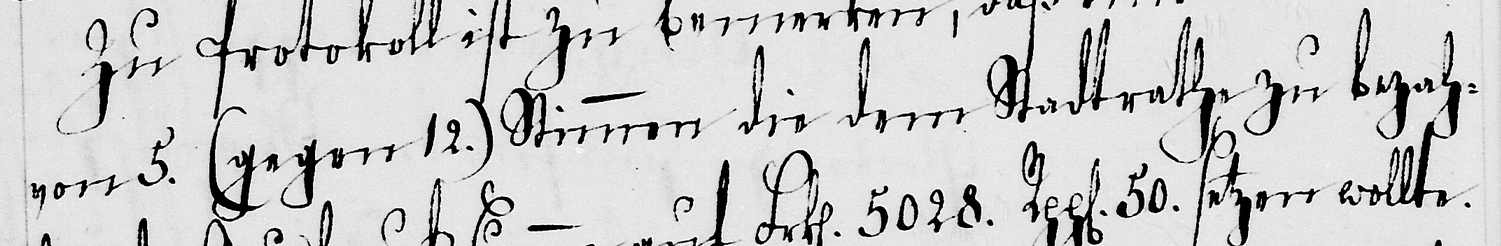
von 5. (gegen 12.) Stimmen die dem Stadtrathe zu bezah¬
